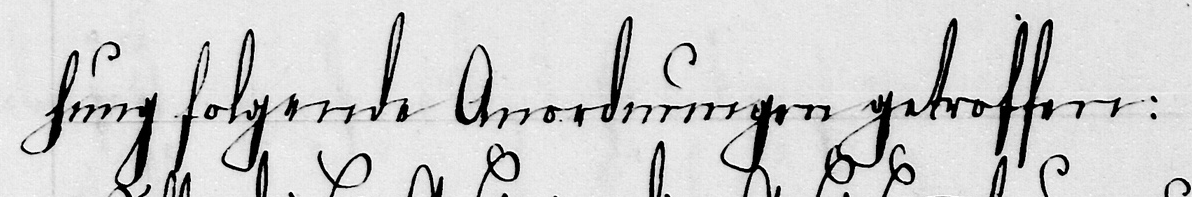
hung folgende Anordnungen getroffen:
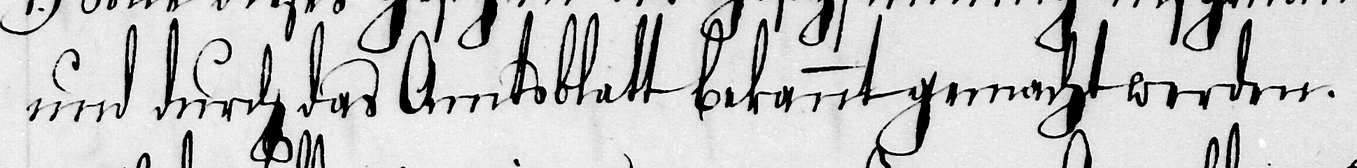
und durch das Amtsblatt bekannt gemacht werden.
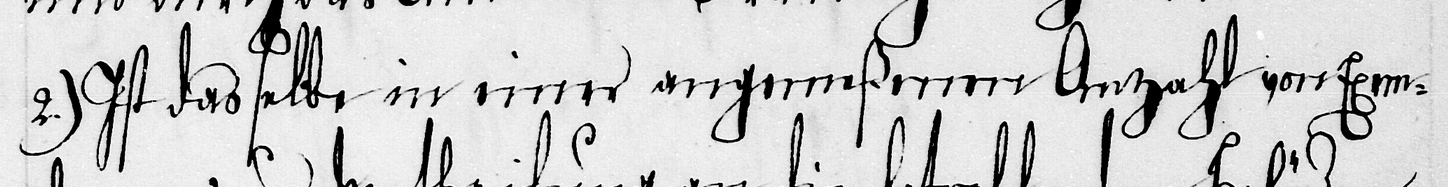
2.) Ist dasselbe in einer angemessenen Anzahl von Exemp¬
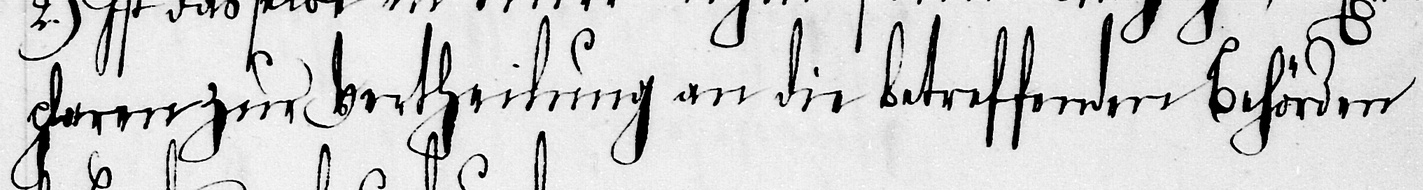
laren zur Vertheilung an die betreffenden Behörden
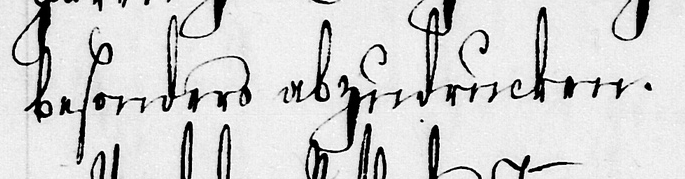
besonders abzudrucken.
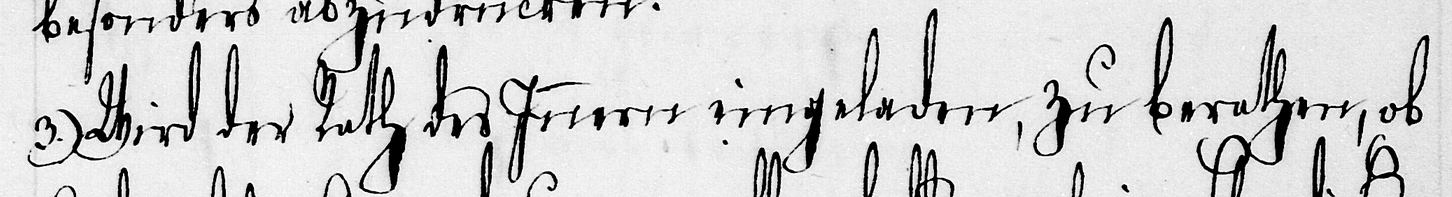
Wird der Rath des Innern eingeladen, zu berathen, ob
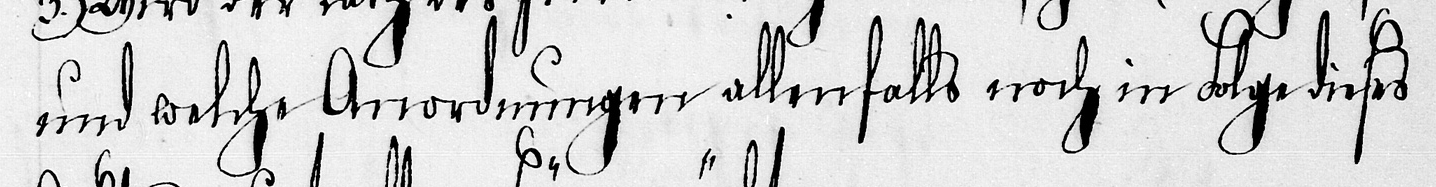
und welche Anordnungen allenfalls noch in Folge dies¬
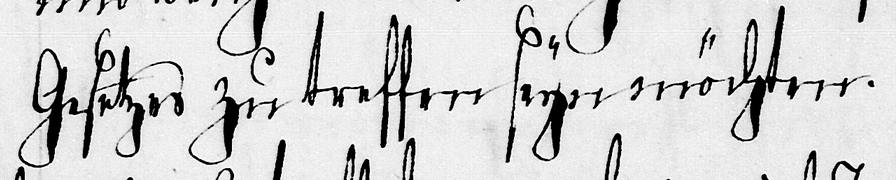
Gesetzes zu treffen seyn möchten.
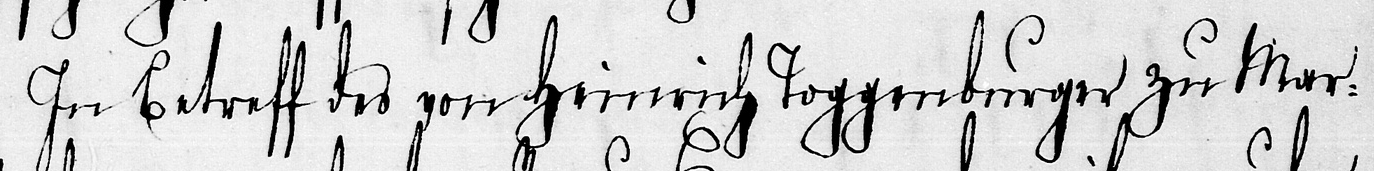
In Betreff des von Heinrich Toggenburger zu Mar¬
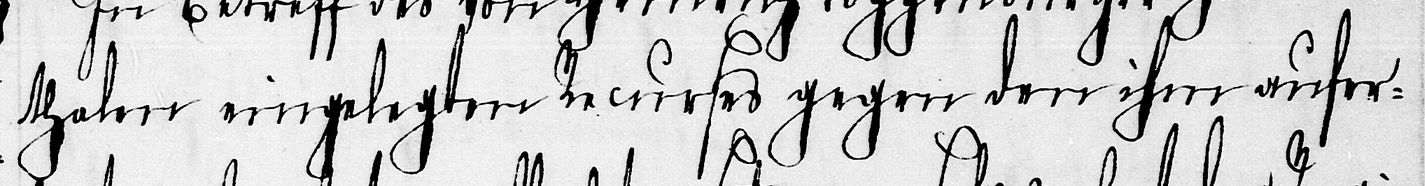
thalen eingelegten Recurses gegen den ihm aufer¬
